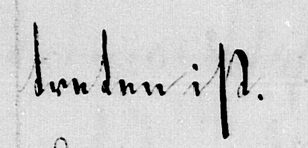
treten ist.
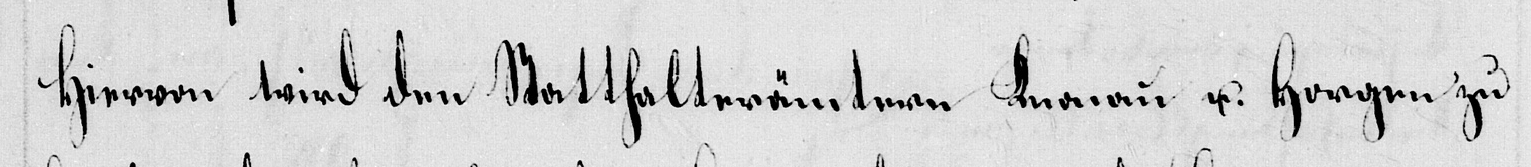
Hiervon wird den Statthalterämtern Knonau u. Horgen zu
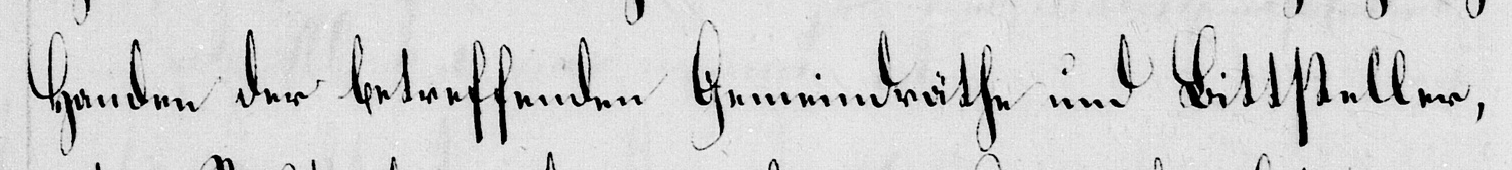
Handen der betreffenden Gemeindräthe und Bittsteller,
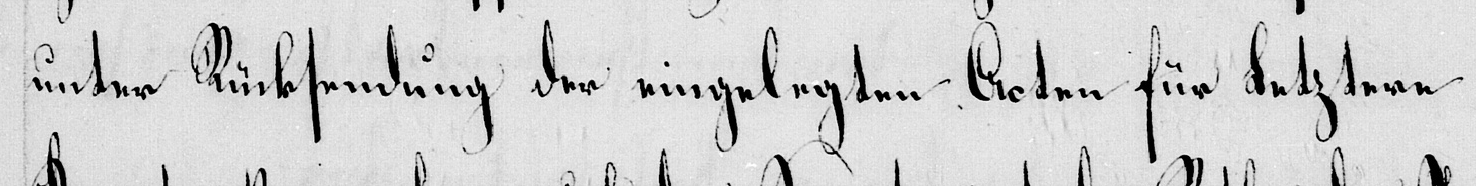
unter Rücksendung der eingelegten Acten für Letztere
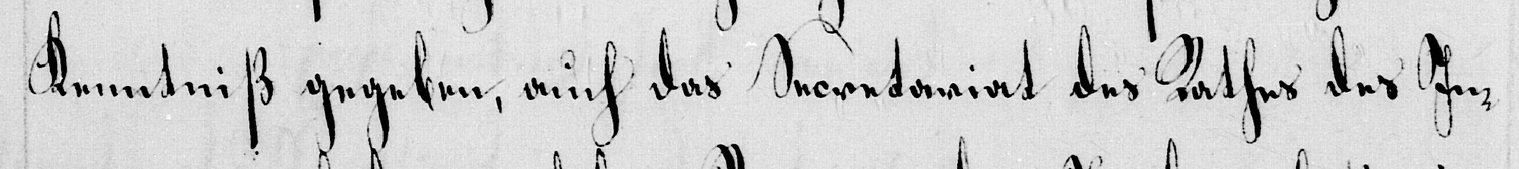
Kenntniß gegeben, auch das Secretariat des Rathes des In¬
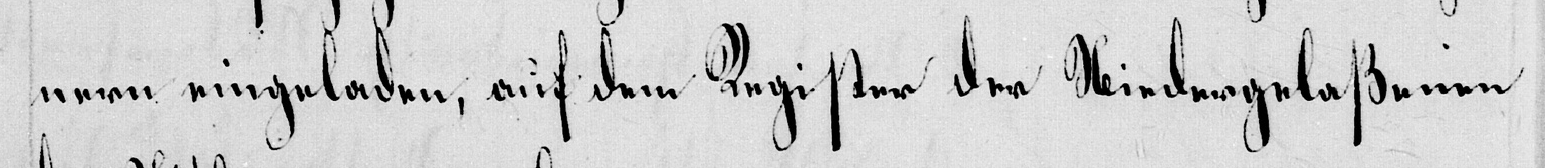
nern eingeladen, auf dem Register der Niedergelaßenen
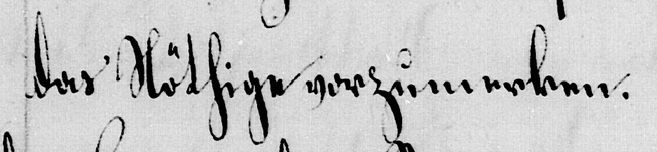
das Nöthige vorzumerken.
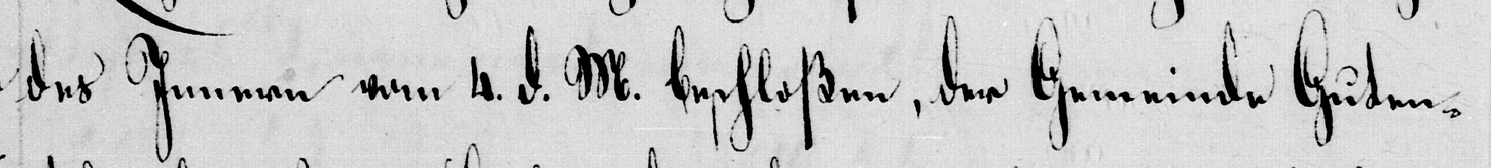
des Innern vom 4. d. M. beschloßen, der Gemeinde Guten¬
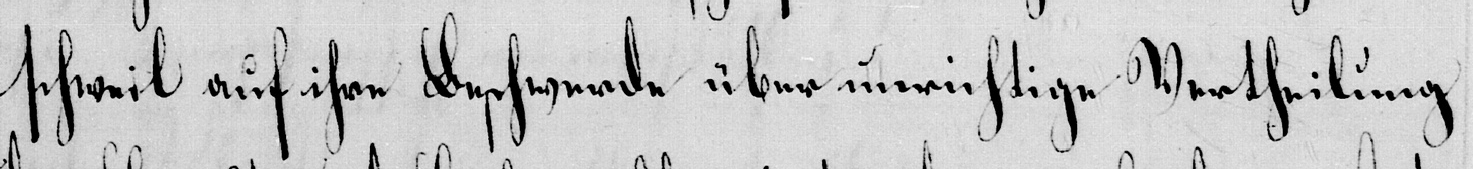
schweil auf ihre Beschwerde über unrichtige Vertheilung
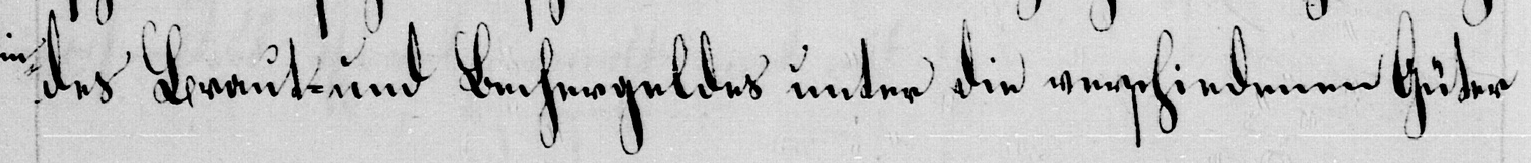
des Braut- und Bechergeldes unter die verschiedenen Güter
